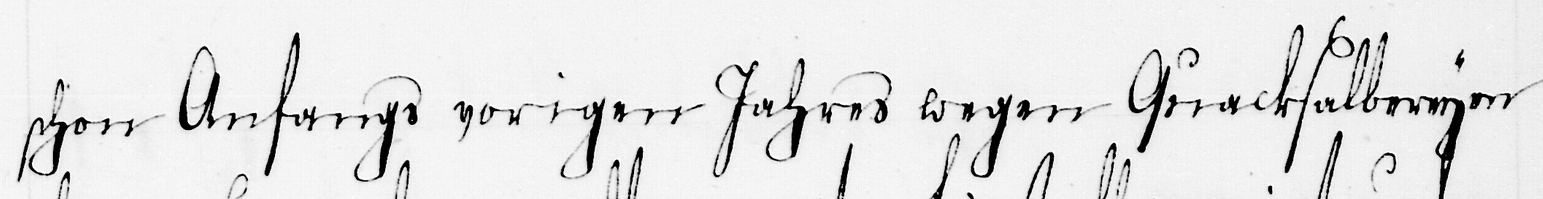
schon Anfangs vorigen Jahres wegen Quacksalbereyen
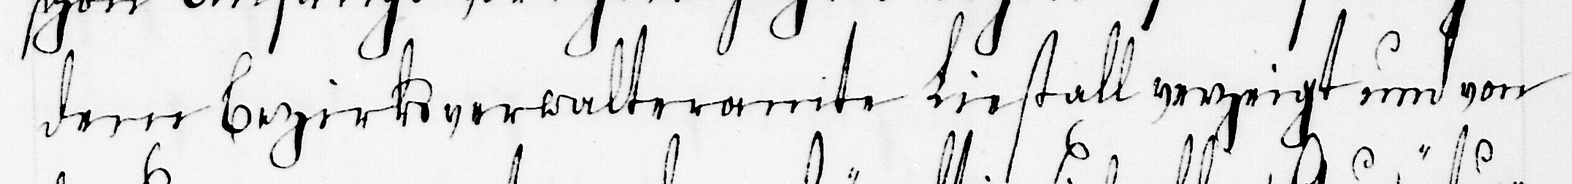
dem Bezirksverwalteramte Liestall verzeigt und von
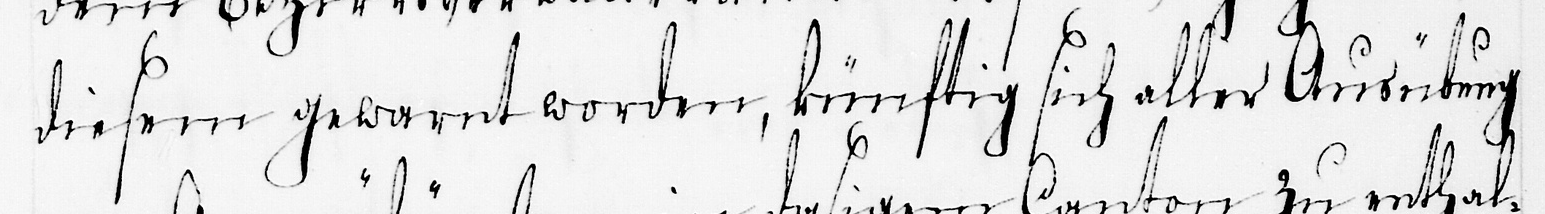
diesem gewarnt worden, künftig sich aller Ausübung
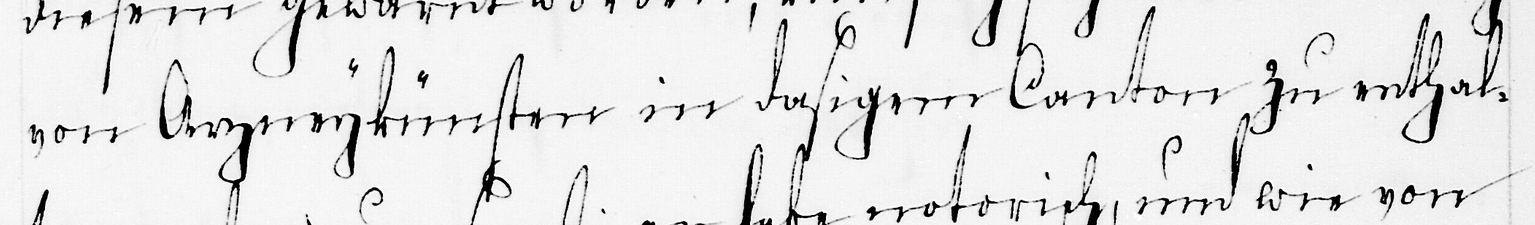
von Arzneykünsten in dasigem Canton zu enthal¬
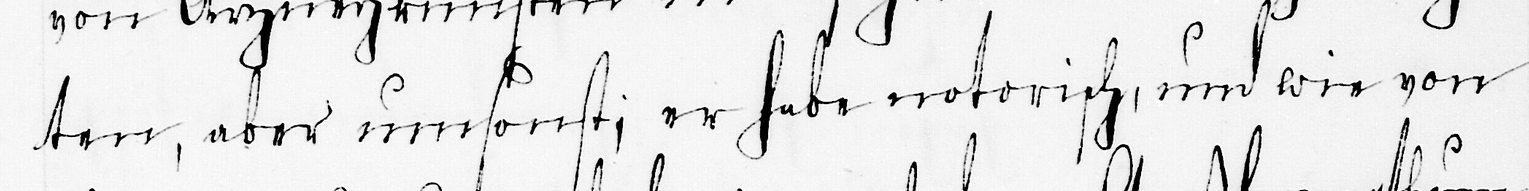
ten, aber umsonst; er habe notorisch, und wie von
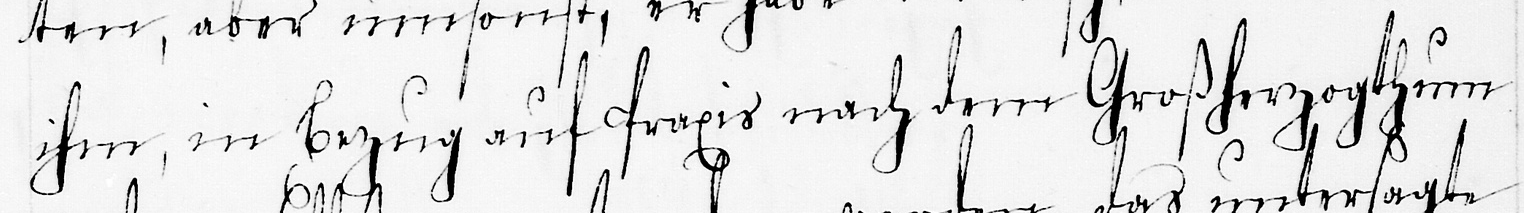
ihm, in Bezug auf Praxis nach dem Großherzogthum
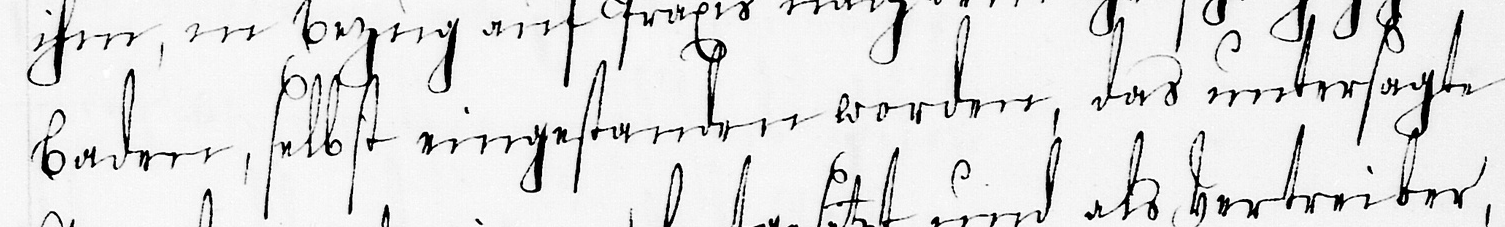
Baden, selbst eingestanden worden, das untersagte
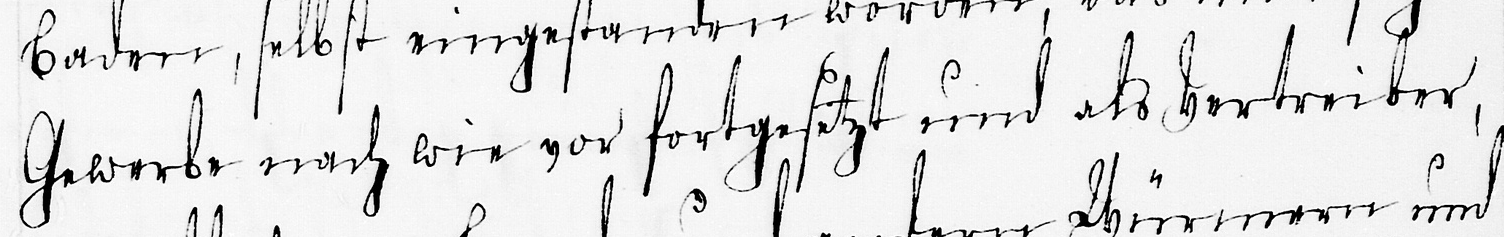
Gewerbe nach wie vor fortgesetzt und als Vertreiber,
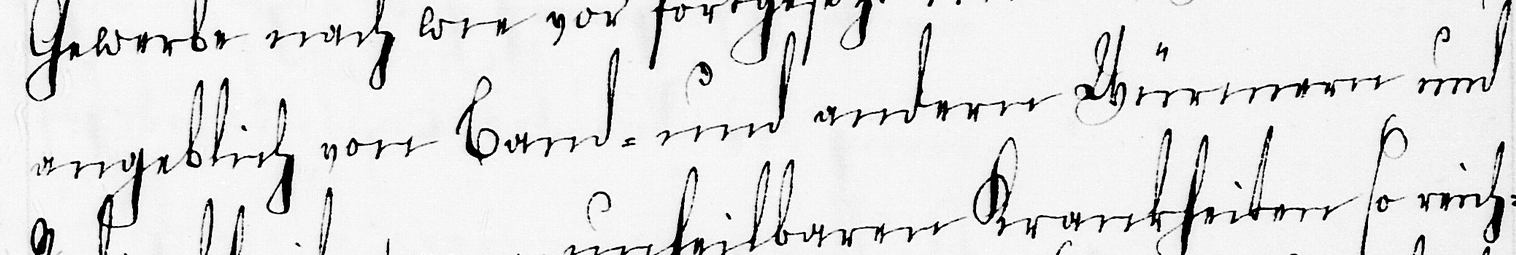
angeblich von Band- und andern Würmern und
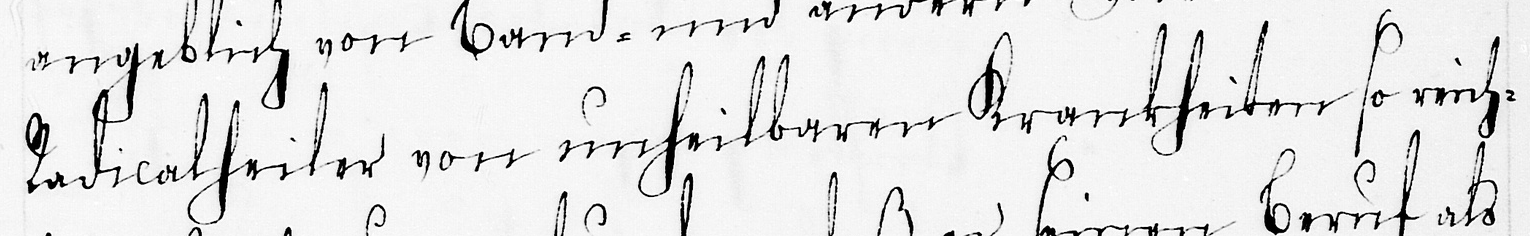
Radicalheiler von unheilbaren Krankheiten so reic¬
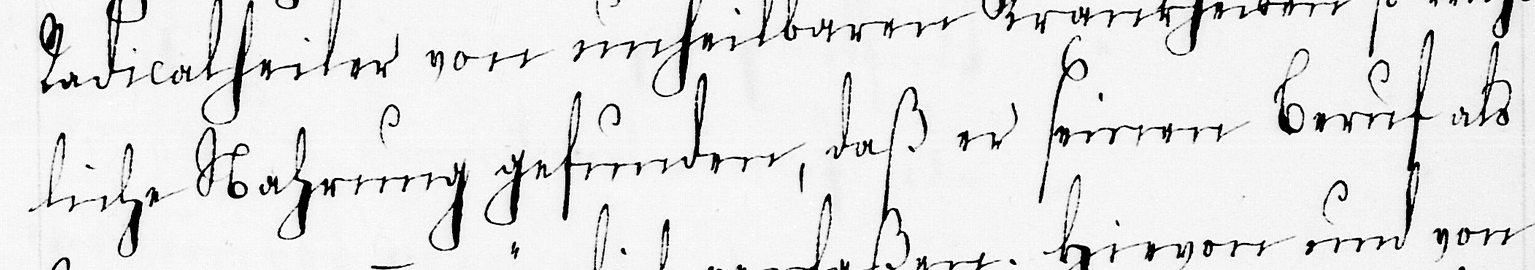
hliche Nahrung gefunden, daß er seinen Beruf als
